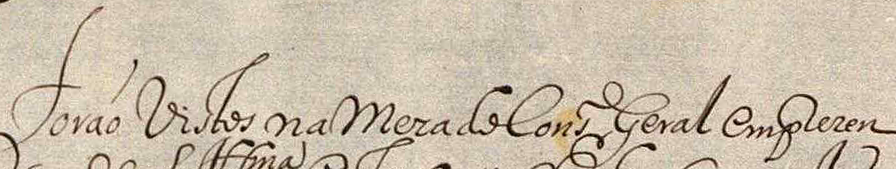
Foraõ vistos na Meza do Cons.o Geral em pRezen
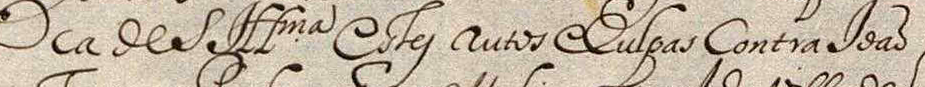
ça de S Ill.ma estes autos e Culpas Contra Ioaõ
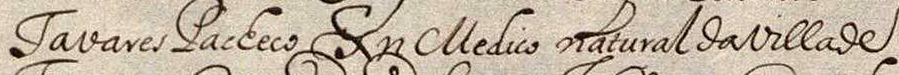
Tavares Pacheco xn Medico natural da villa de
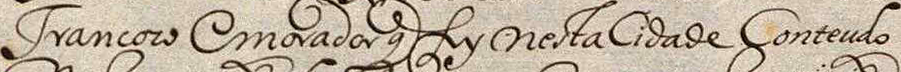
Trancozo E morador q̄ foy nesta Cidade Conteudo
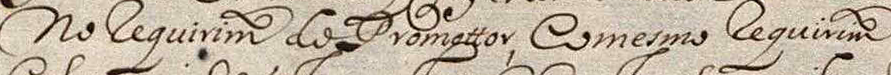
no Requirim.to do Promottor, E o mesmo Requirim.to
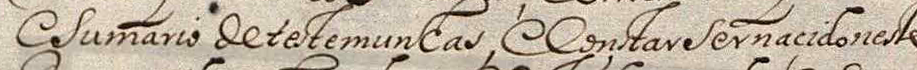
E Sumario de testemunhas, E Constar ser nacido neste
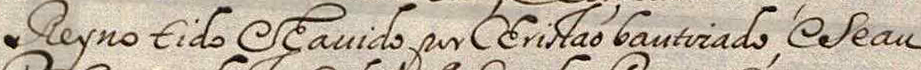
Reyno tido E hauido por Christaõ bautizado, E se au
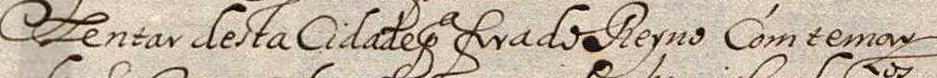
Zentar desta Cidade pa fora do Reyno Com temor
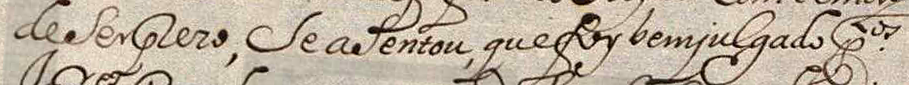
de ser pRezo, Se asentou, que foy bem julgado p.los
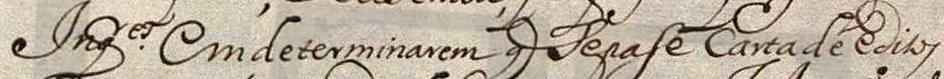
Inq.res Em determinarem q̄ Se pase Carta de editos
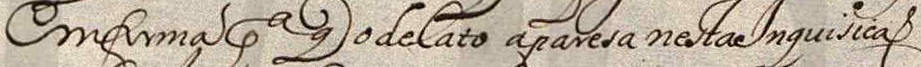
Em forma pa q̄ o delato aparesa nesta Inquisiçaõ
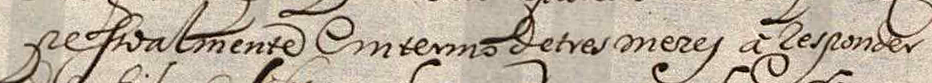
pessoalmente Em termo de tres mezes a Responder
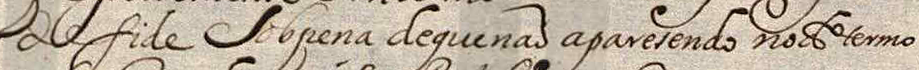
de fide Sob pena de que naõ aparesendo no d̄o termo
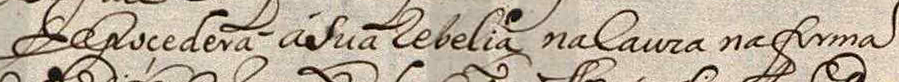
se pRocederá á Sua Rebelia na Cauza na forma
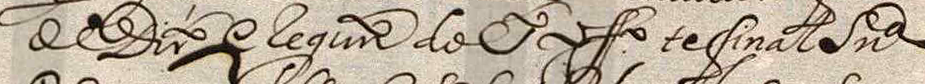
de Dirto e Regimto do S.to Off.o te final Snça
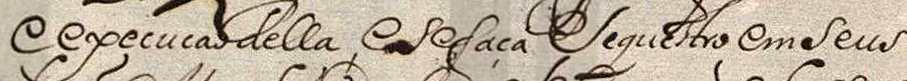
e execuçaõ della, E se faça Sequestro em seus
